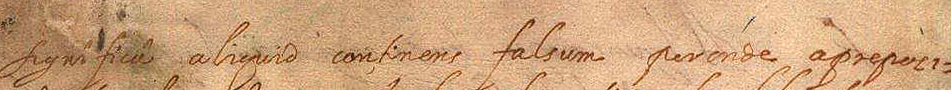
significa aliuio continens falsum perante a preposi
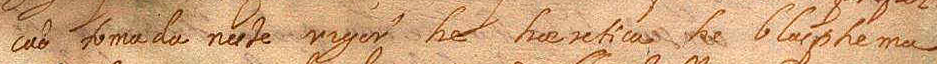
çaõ tomada neste rigor he heretica he basphema
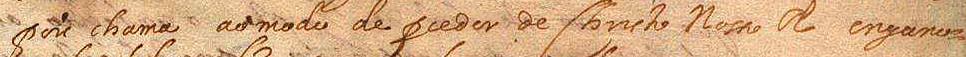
pois chama ao modo de ꝓceder de Christo Nosso R engano
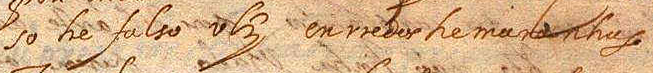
so he falso vlz̄ enrredos he maranhas
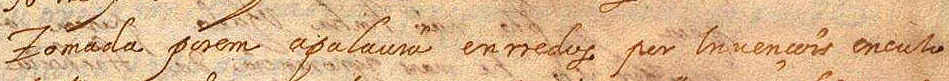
Tomada porem a palaura enrredos por Inuençoĩs en cuio
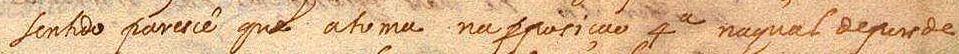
sentido parescē que a toma na ꝓposiçaõ 4a na qual depois de
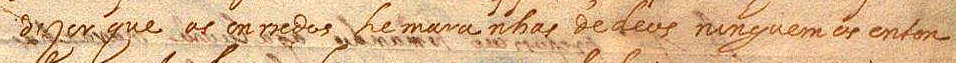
dizer que os enrredos he maranhas de deos ninguem os enten
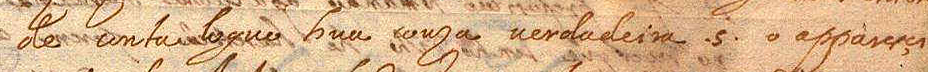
de conta loguo hua couza uerdadeira .s. o apparesci
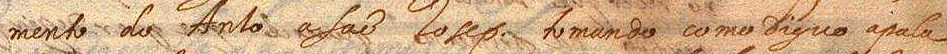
mento do AnIo a saõ Iosep. tomando como diguo a pala
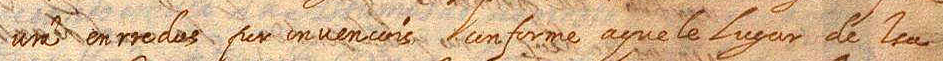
ura enrredos por inuençoĩs conforme aquele Lugar de Isa
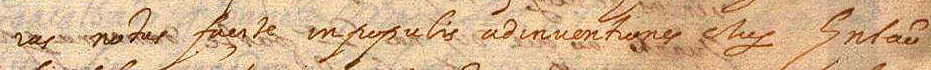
ras notus fuerte inpopulis ad inuentiones eIus Entaõ
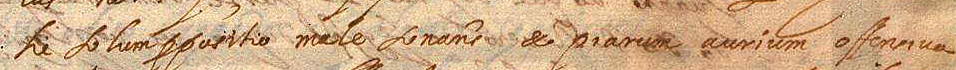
he solum ꝓpositio male sonans & piarum aurium offensiua
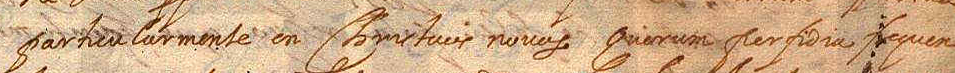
particularmente en Christans nouus Quorum perfidia, frequen
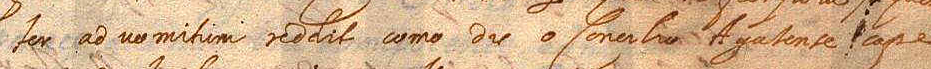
ter ad uomitum reddit como dis o Concilio Agatense cape
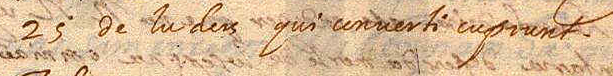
25 de Iudeis qui conuerti cupiunt.
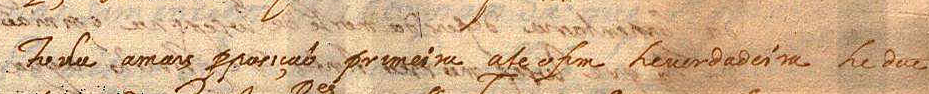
Toda a mais ꝓposiçaõ primeira ate o fim he uerdadeira he dou
